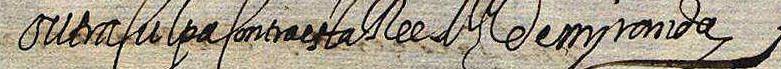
Outra Culpa Contra esta Ree Ma de mjranda
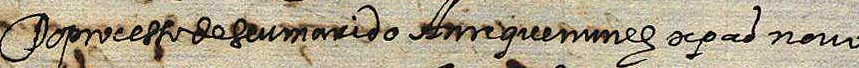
Do processo de seu marido Anrique nunez xpaõ nouo
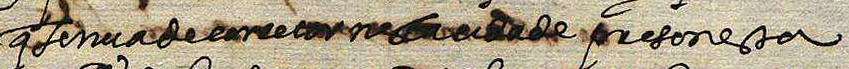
q̄ seruia de corretor nesta cidade preso nesta
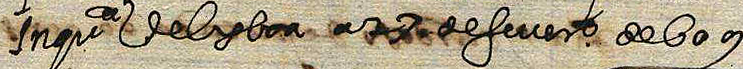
Inqucā de lisboa a 27 de feuero. de 609
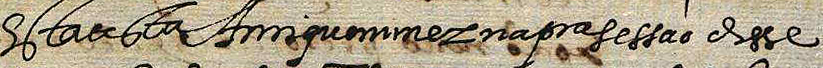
Esta testa Anrique nunez na pra sessaõ disse
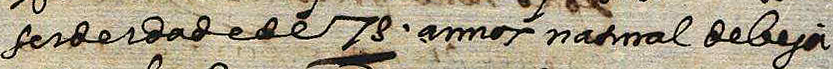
ser de idade de 73. annos natural de beja
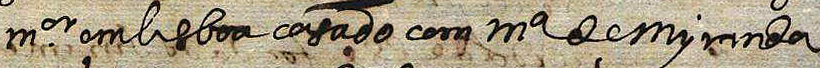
m.or em lisboa casado com ma de myranda
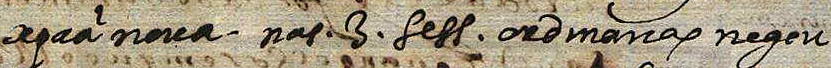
xpaã noua. nas .3. sess. ordinarias negou
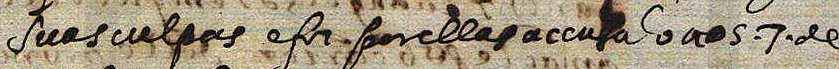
suas culpas e foi por ellas accusado aos .7. de
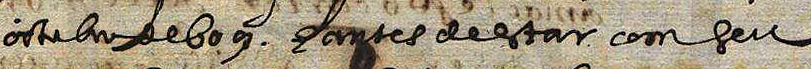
oitubro de 609. E antes de estar com seu
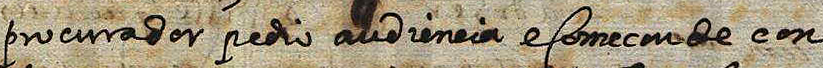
procurador pedio audiencia e Comecou de con
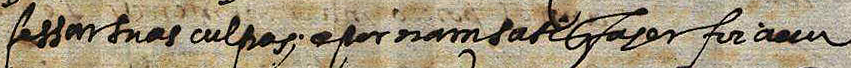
fessar suas culpas; e por nam satisfazer foi accu
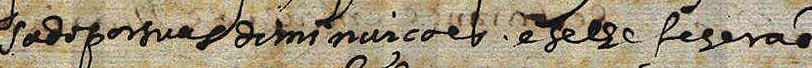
sado por suas deminuiçoẽs. e se lhe fezeraõ
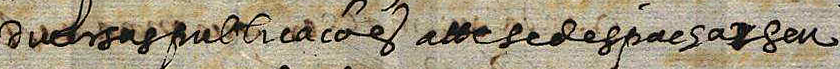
diuersas publicacões atte se despachar seu
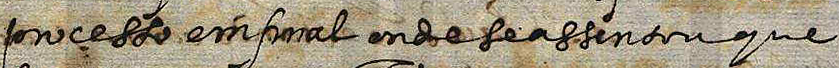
processo em final onde se assentou que
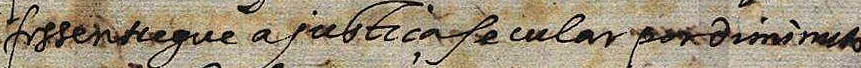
fosse entregue a justiça secular por diminuto
